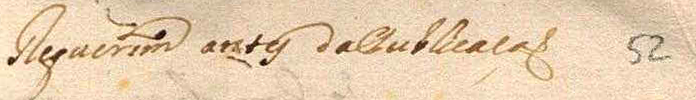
Requerimto antes da Publicaçaõ 52
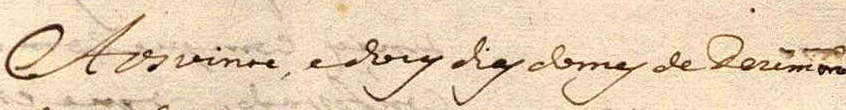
Aos vinte, e dous dias do mes de Dezem_ro
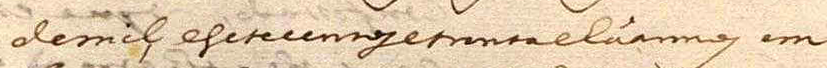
de mil, e setecentos e trinta e hū annos em
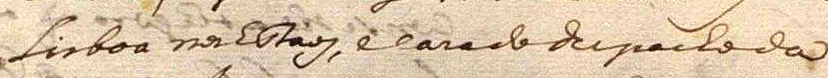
Lisboa nos Estaos, e caza do despacho da
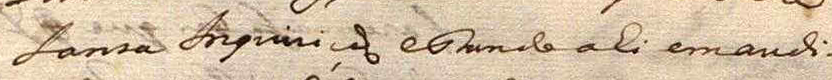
santa Inquizicaõ estando ahi em audi
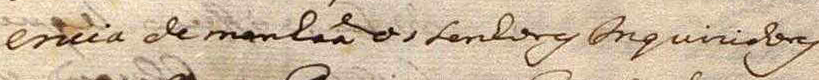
encia de manhaã os senhores Inquizidores
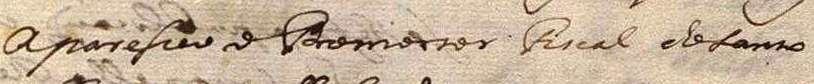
aparesseo o Promortor Fiscal do santo
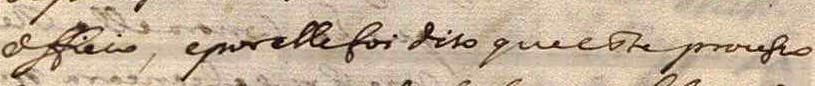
officio, e por elle foi dito que este processo
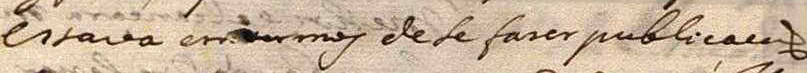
estava em termos de se fazer publicaçaõ
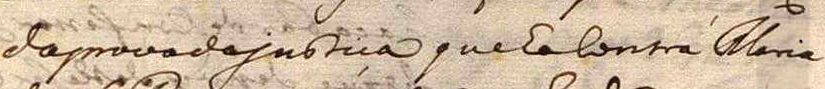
da prova da justiça que ha contra Maria
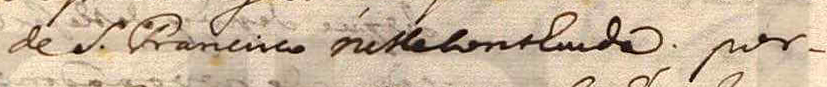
de S. Francisco nelle contheuda; por
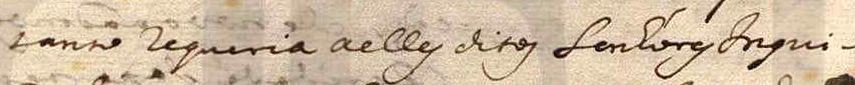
tanto requeria a elles ditos senhores Inqui
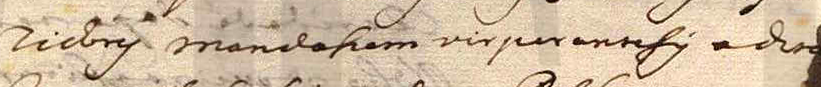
zidores mandassem vir perante sy a dito
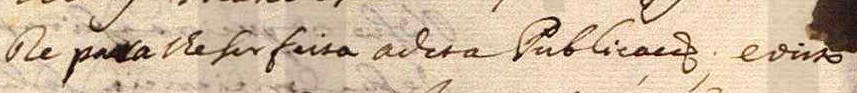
Re para lhe ser feita a dita Publicação, e visto
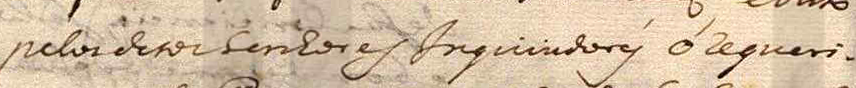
pelos ditos senhores Inquisidores o Requeri
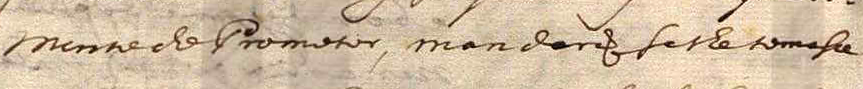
mento do Promotor, mandaraõ se lhe tomasse
